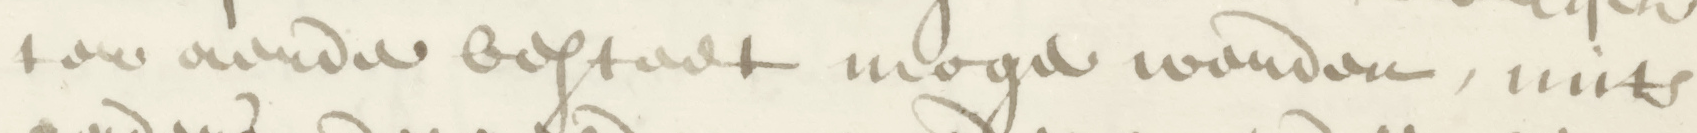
ter aerde besteet moge werden, mits
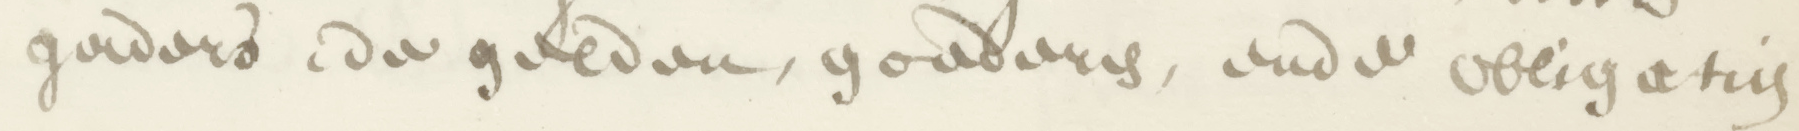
„gaders, de gelden, goederen, ende obligatien
